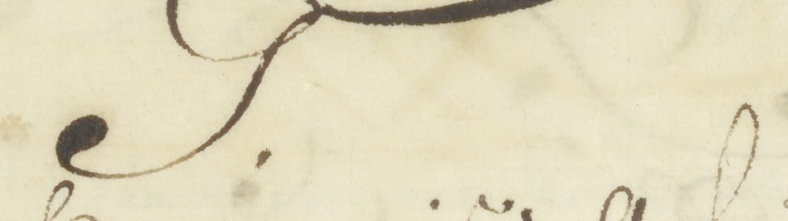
G
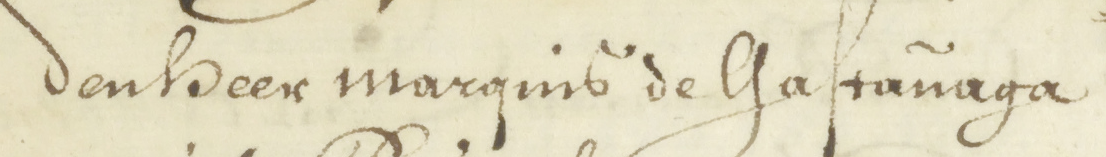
den Heer Marquis de Gastaňaga
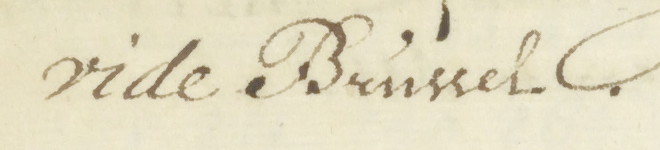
vide Brussel.
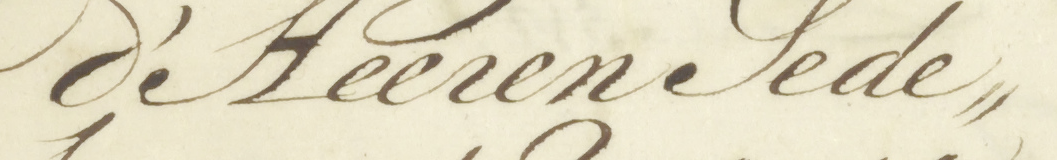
d'Heeren Gede,,
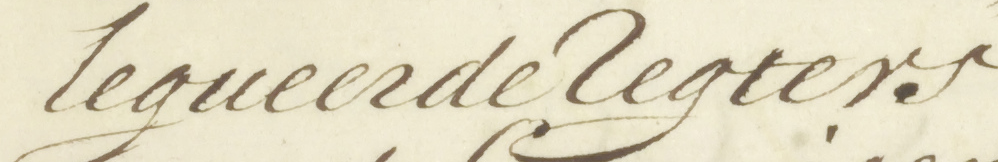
legueerde regters
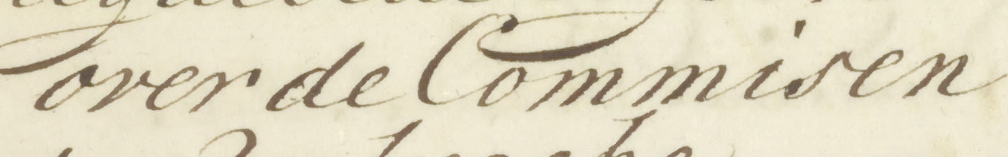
over de Commisen
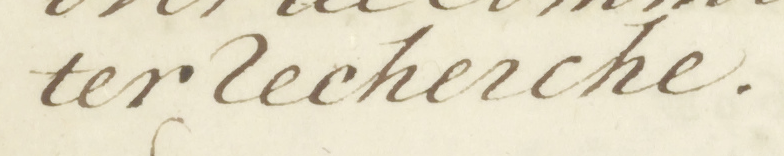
ter Recherche
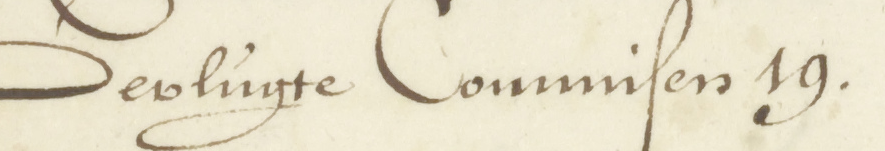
Gevlugte Commisen 19.
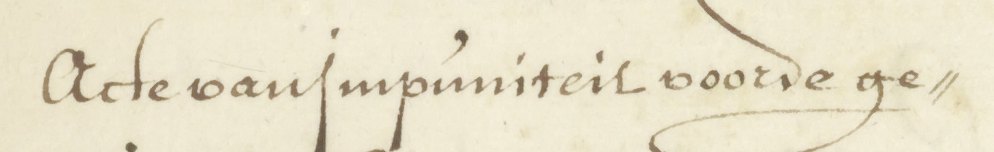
Acte van Impuniteit voorde ge,,
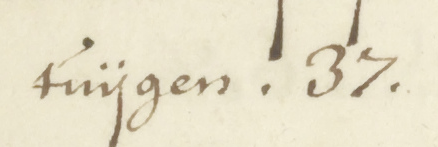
tuijgen, 37.
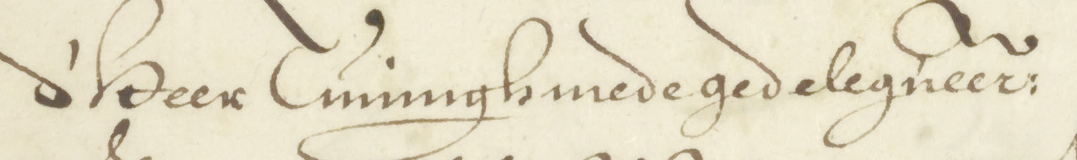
d'heer Tuningh mede gedelegueer:
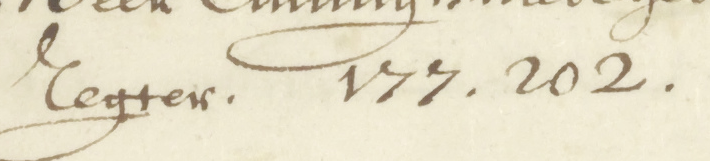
regter. 177, 202.
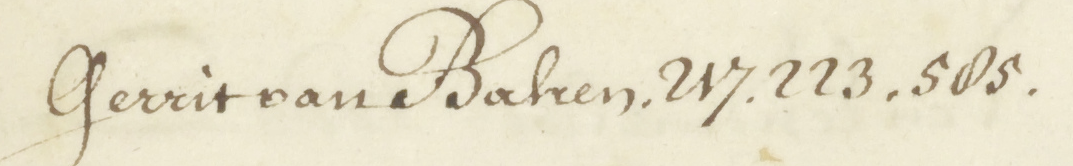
Gerrit van Baken, 217, 223, 585.
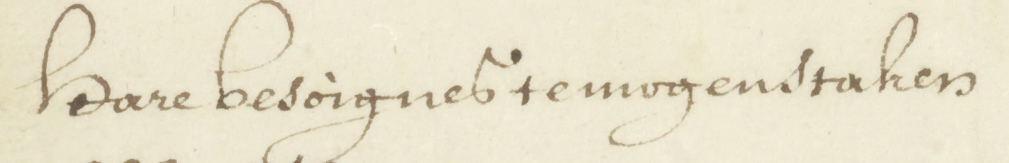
hare besoignes te mogen staken
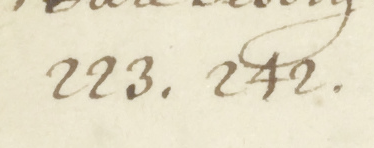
223, 242.
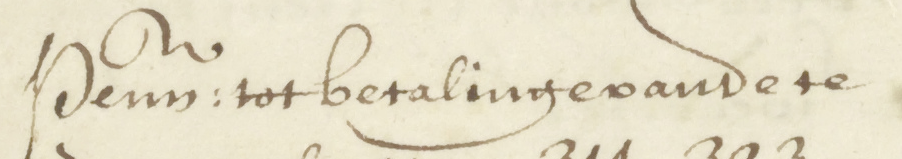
Penn: tot betalinge vande te
